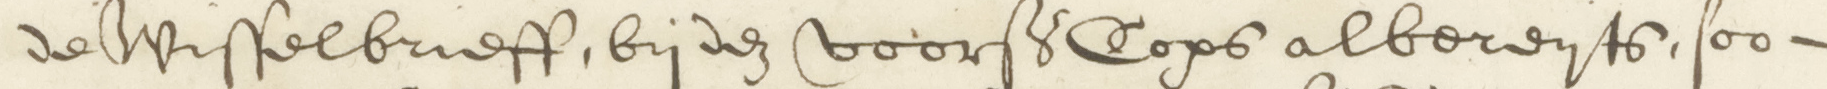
de Wisselbrieff, bij den voors Cops albereijts, soo -
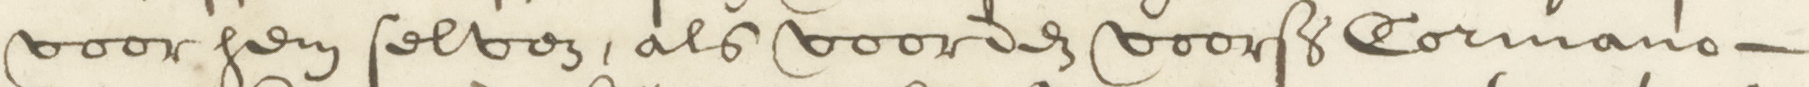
voor hem selven, als voorden voors Cormano-
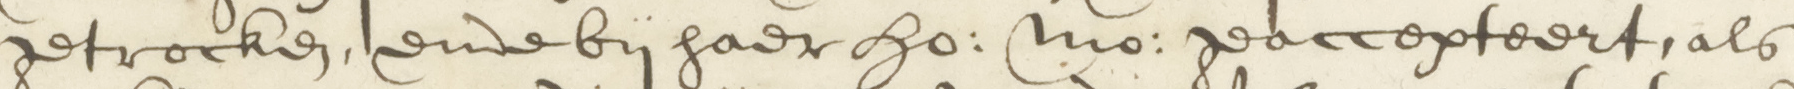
getrocken, ende bij haer Ho:Mo: geaccepteert, als
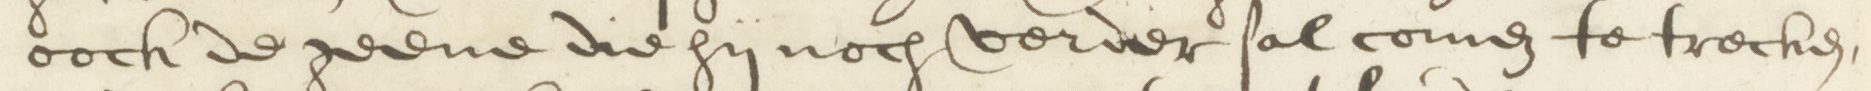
oock de geene die hij noch verder sal comen te trecken,
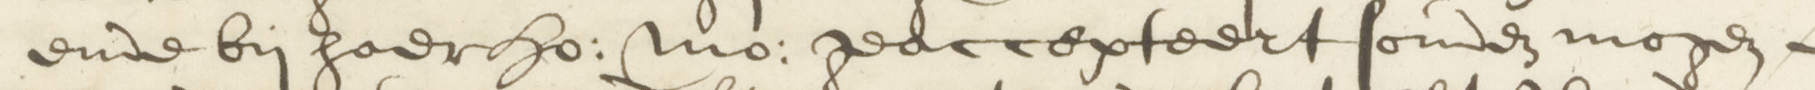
ende bij haer Ho:Mo: geaccepteert souden mogen-
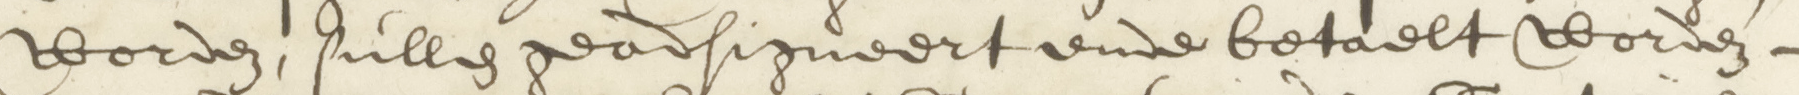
worden, sullen geadsigneert ende betaelt worden-
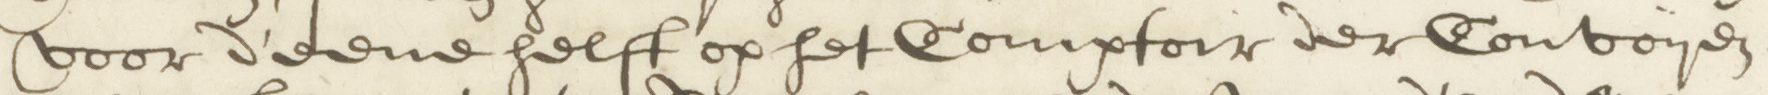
voor d‛eene helft op het Comptoir der Convoijen
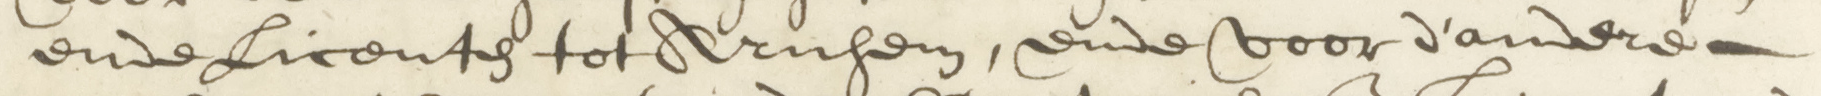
ende Licenten tot Arnhem, ende voor d'andere —
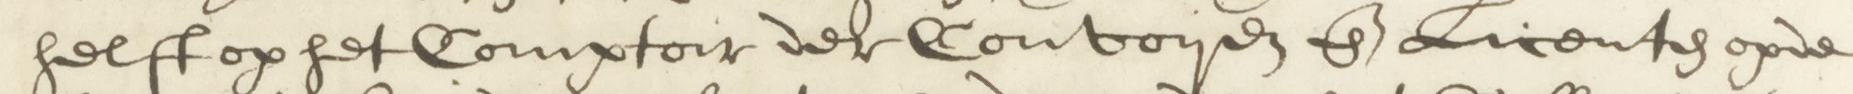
helft op het Comptoir der Convoijen & Licenten opde
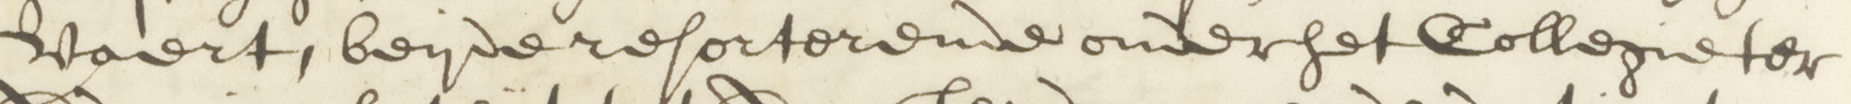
Vaert, beijde resorterende onder het Collegie ter
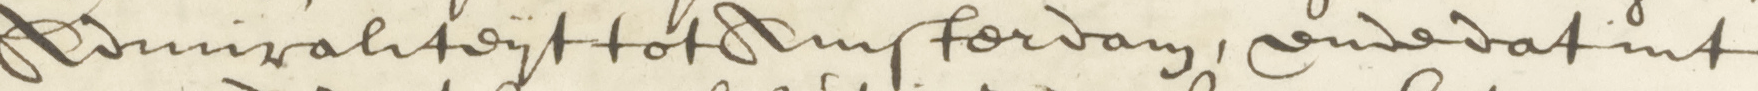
Admiraliteijt tot Amsterdam, ende dat int
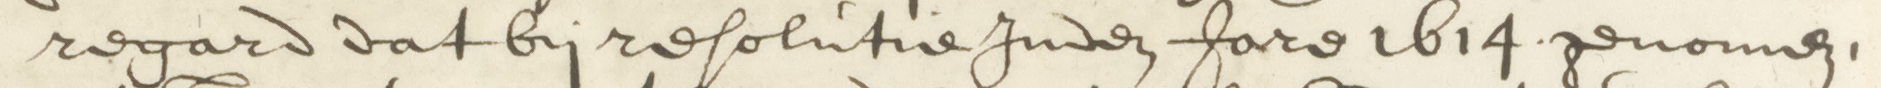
regard dat bij resolutie Inden Jare 1614 genomen,
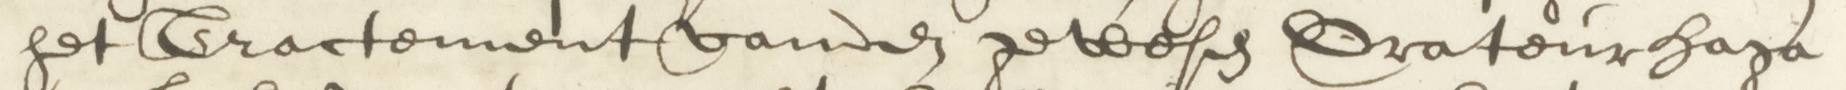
het Tractement vanden gewesen Orateur Haga
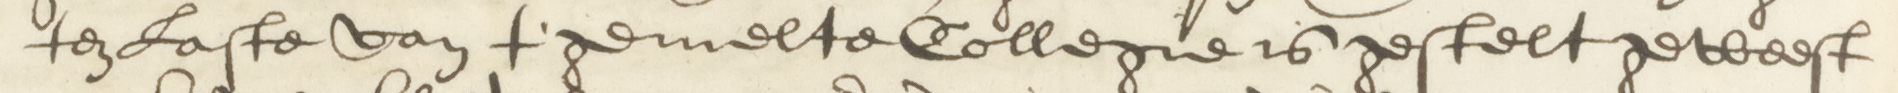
ten Laste van t'gemelte Collegie is gestelt geweest
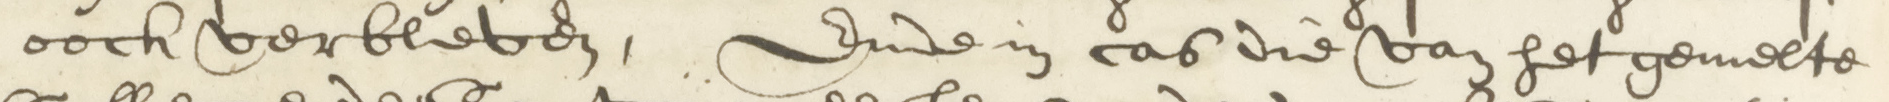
oock verbleven. Ende in cas die van het gemelte
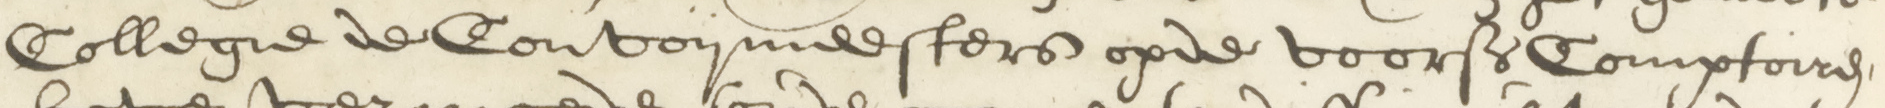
Collegie de Convoijmeesters opde voors Comptoiren,
